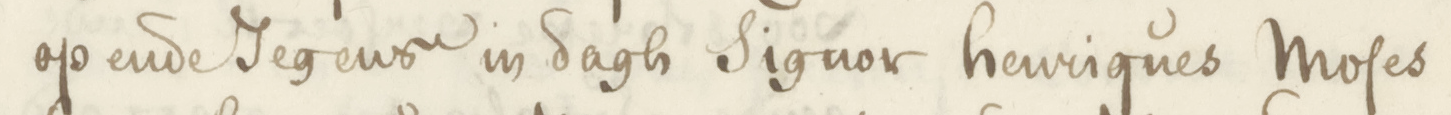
op ende Jegens in dagh Signor henriques Moses
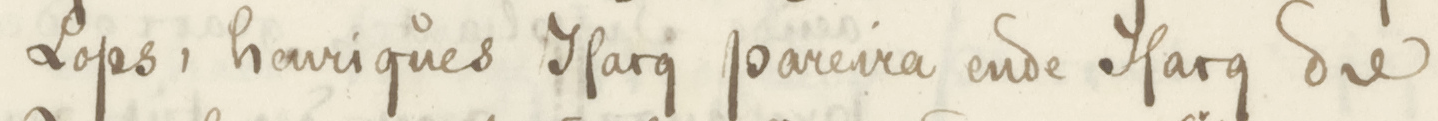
Lops, henriques Isacq pareira ende Isacq de
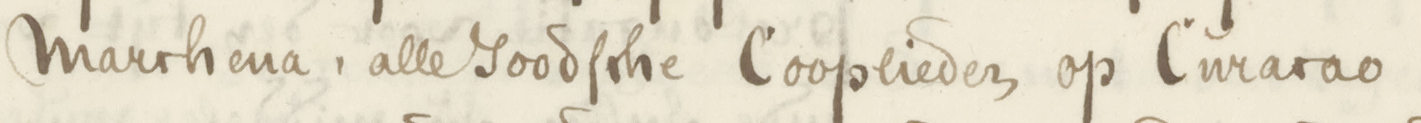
Marchena, alle Joodsche Cooplieden op Curacao
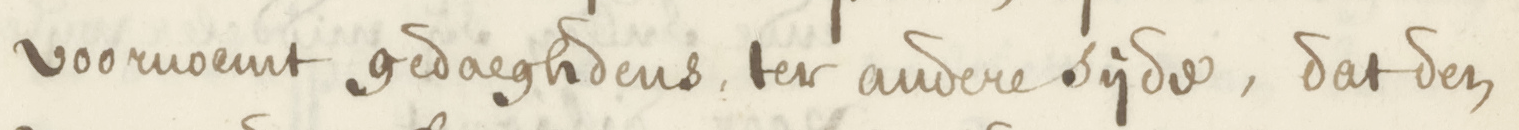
voornoemt gedaeghdens, ter andere sijde, dat den
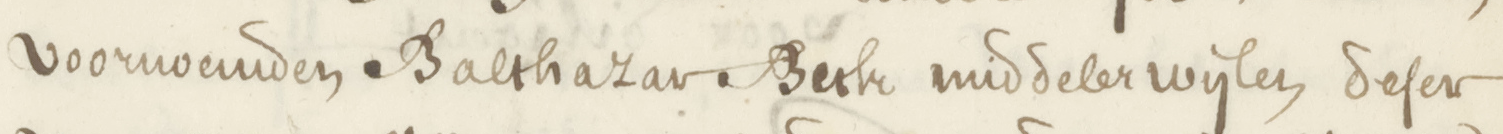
voornoemden Balthazar Beck middelerwijlen deser
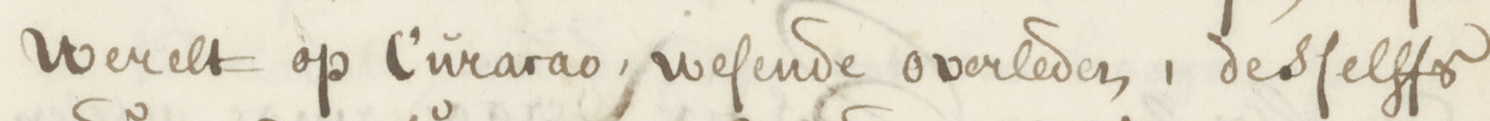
werelt op Curarao, wesende overleden, desselffs
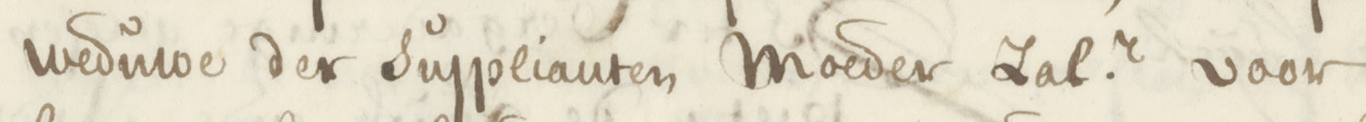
weduwe der Supplianten Moeder Zalr. voor
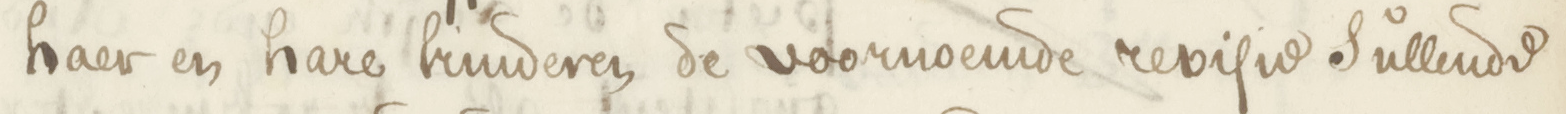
haer en hare kinderen de voornoemde revisie sullende
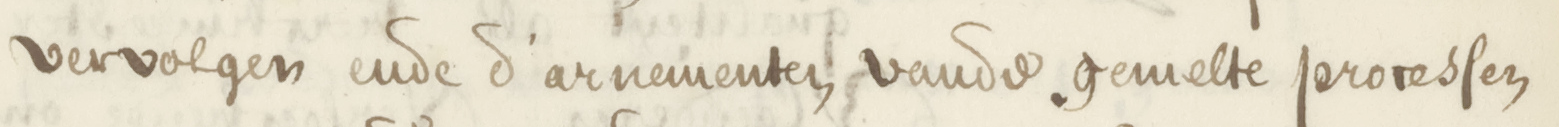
vervolgen ende d'arnementen vande gemelte processen
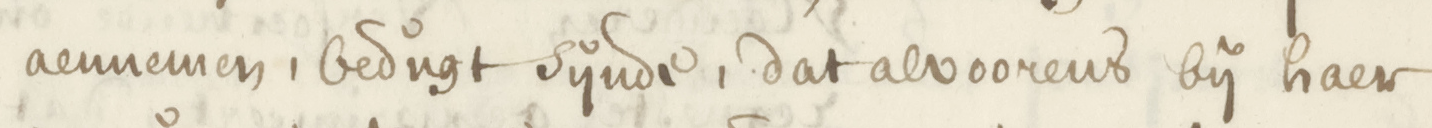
aennemen, bedugt sijnde, dat alvoorens bij haer
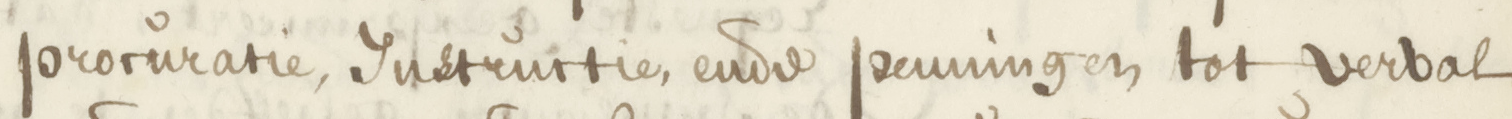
procuratie, Instructie, ende penningen tot verval
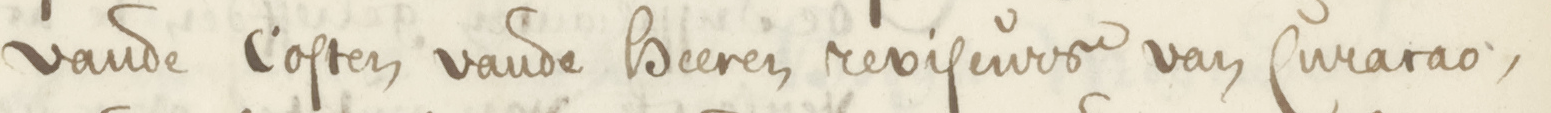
vande costen vande Heeren reviseurs van Curacao,
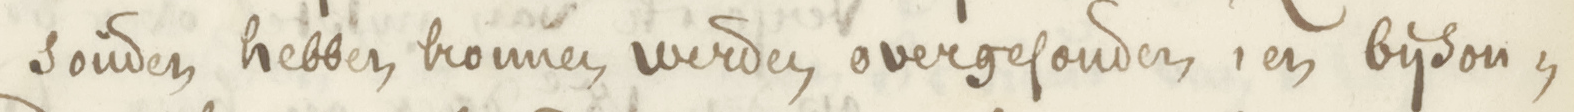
souden hebben konnen werden overgesonden, en bijson„
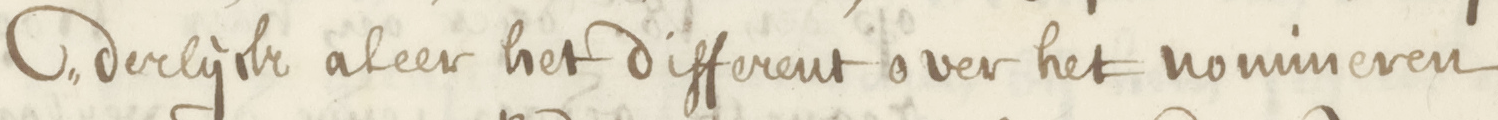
„derlijck aleer het different over het nomineren
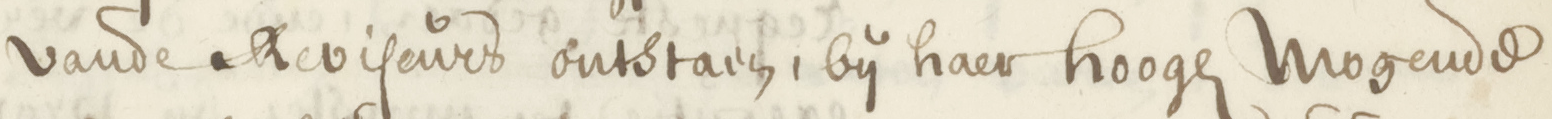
vande Reviseurs ontstaen, bij haer hoogh Mogende
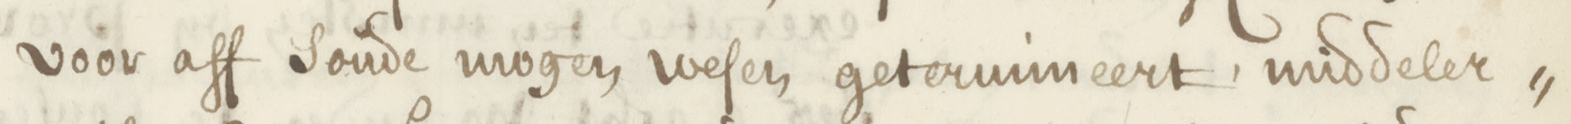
voor aff soude mogen wesen getermineert, middeler„
